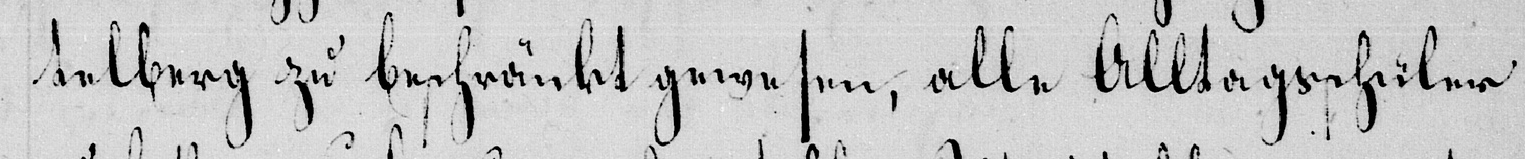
telberg zu beschränkt gewesen, alle Alltagsschüler
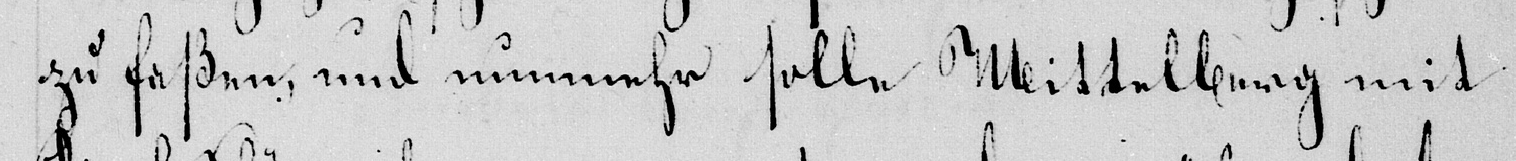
zu faßen, und nunmehr solle Mittelberg mit
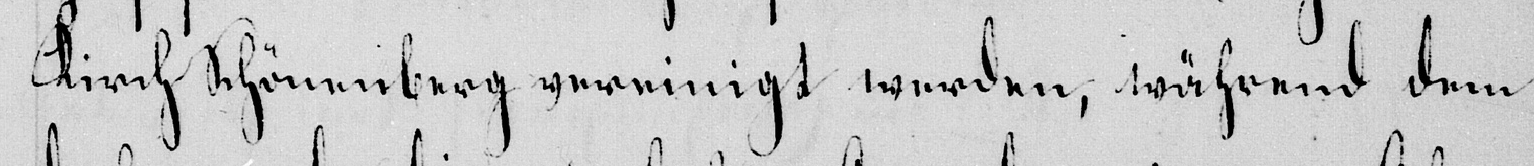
Kirch-Schönenberg vereinigt werden, während dem
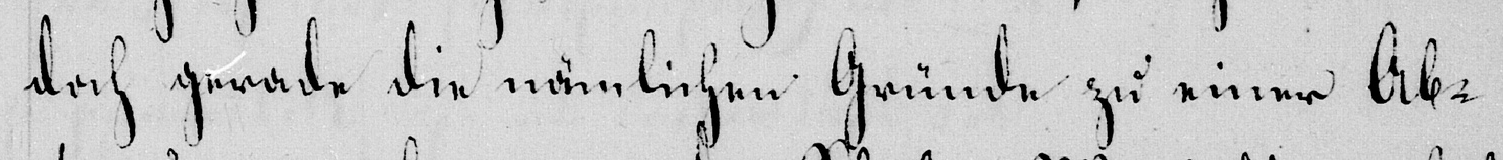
doch gerade die nämlichen Gründe zu einer Ab¬
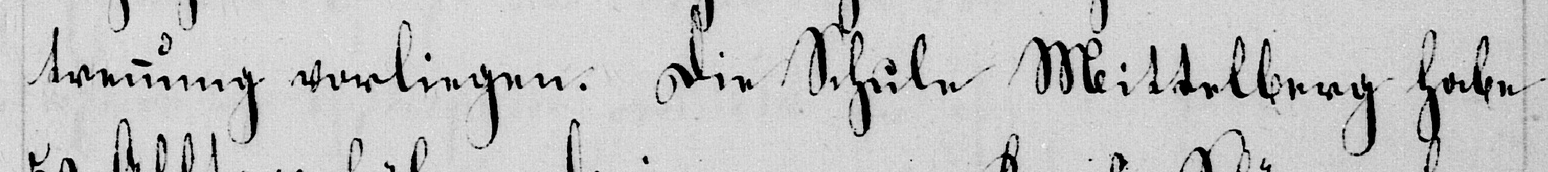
trennung vorliegen. Diese Schule Mittelberg habe
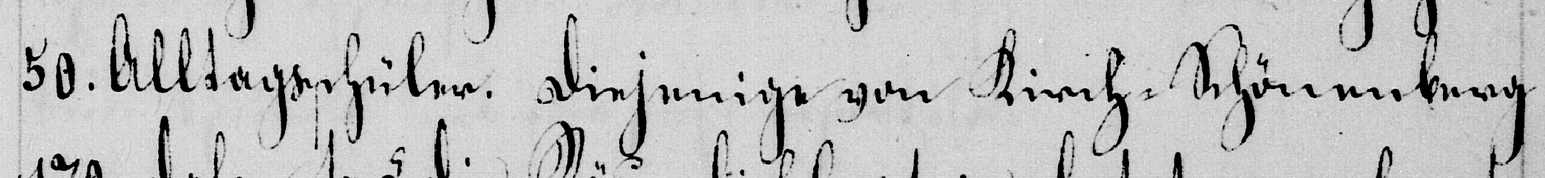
50. Alltagsschüler. Diejenige von Kirch-Schönenberg
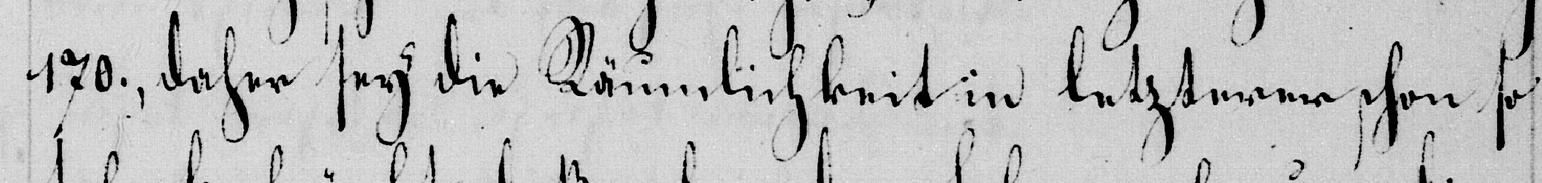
170., daher sey die Räumlichkeit in letzterer schon so
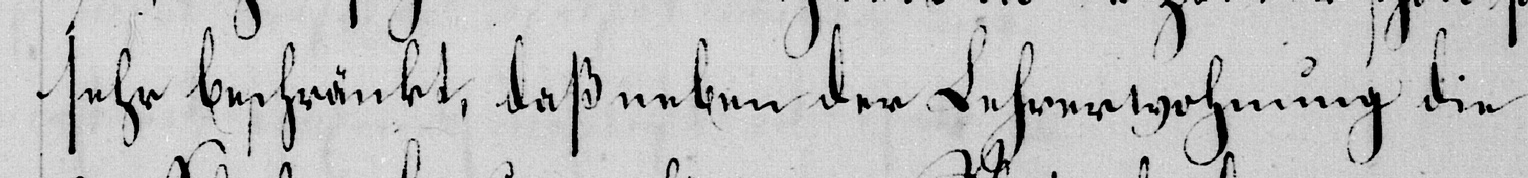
sehr beschränkt, daß neben der Lehrerwohnung die
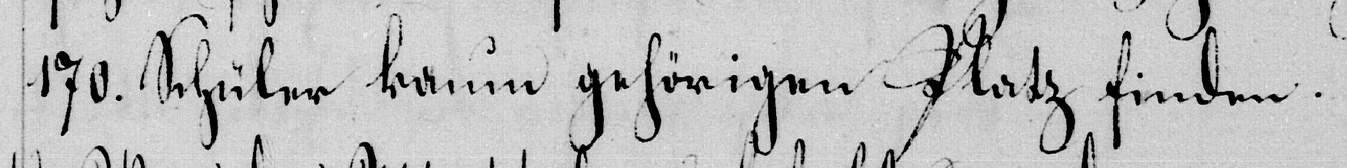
170. Schüler kaum gehörigen Platz finden.
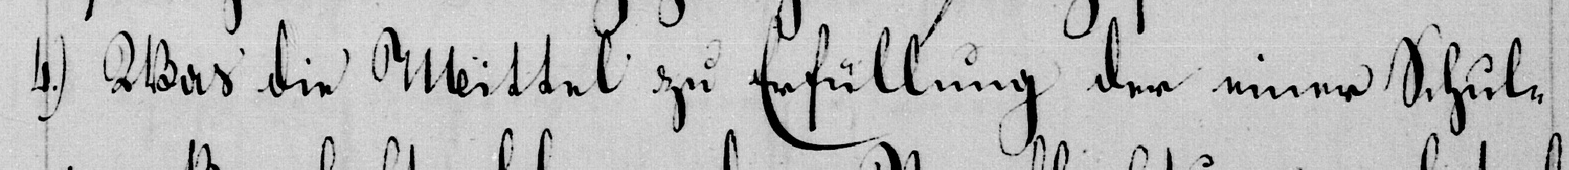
4.) Was die Mittel zu Erfüllung der einer Schul¬
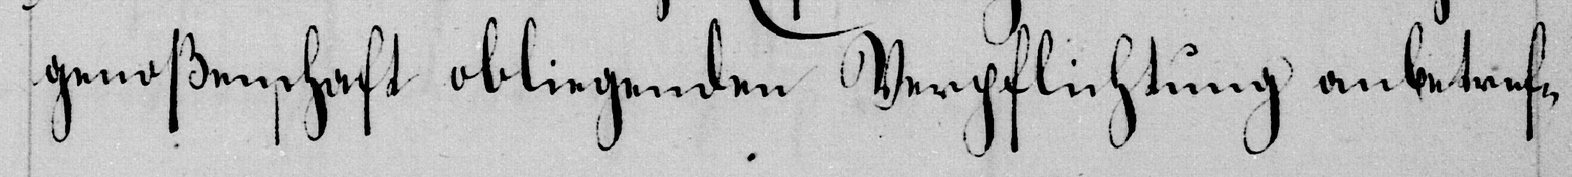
genoßenschaft obliegenden Verpflichtung anbetref-
